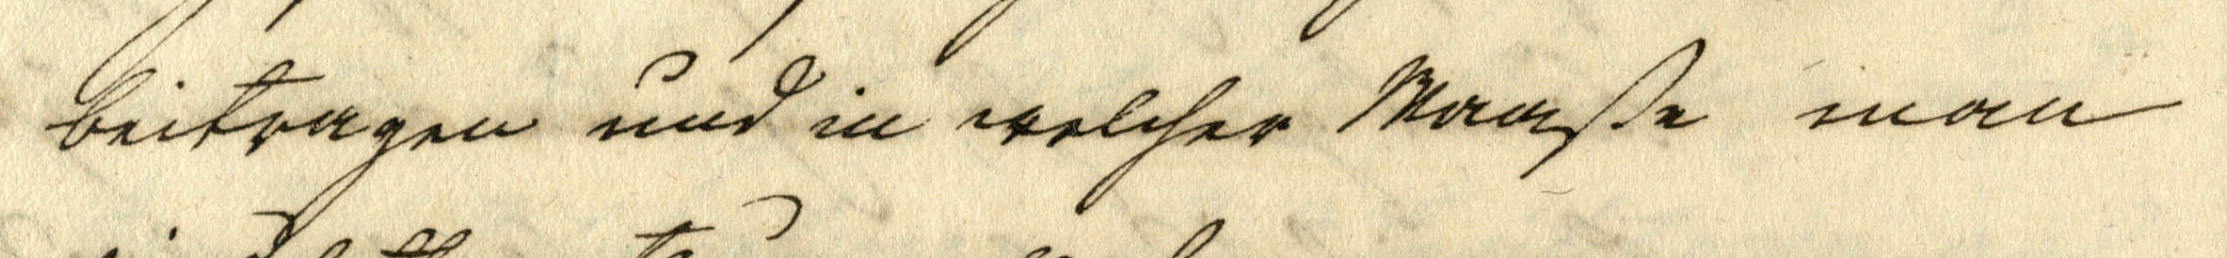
beitragen und in welcher Maaße man
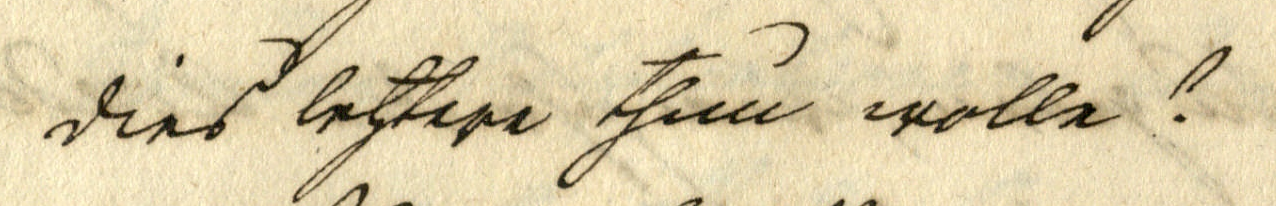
dies letztere thun wolle?
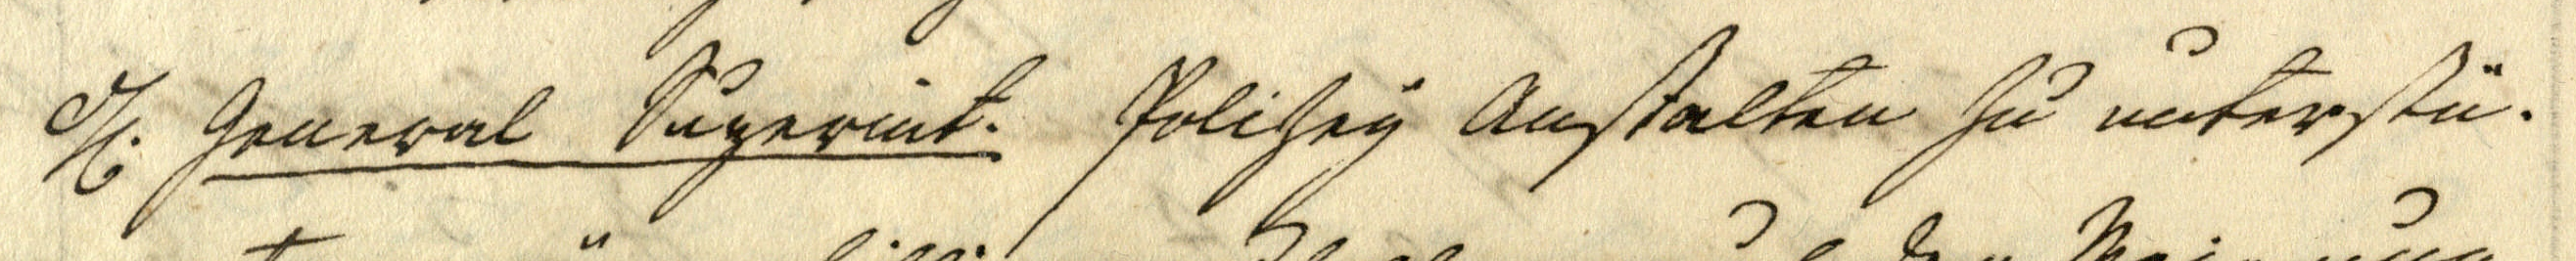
dh. General Superint. Polizey Anstalten zu unterstü-
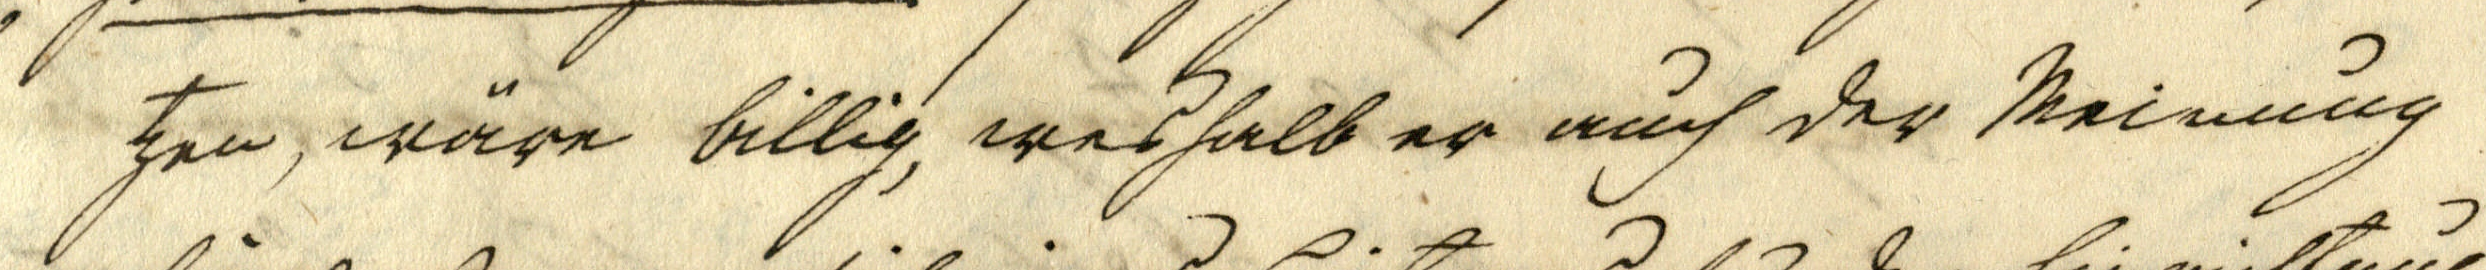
tzen, wäre billig, weshalb er auch der Meinung
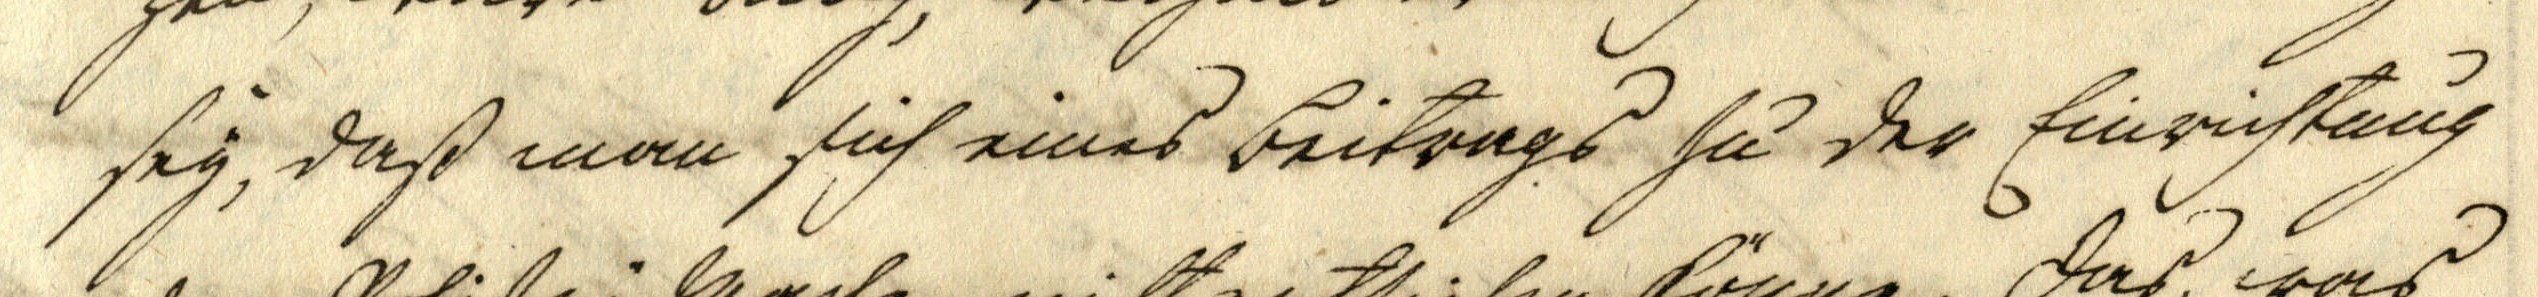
sey, daß man sich eines Beitrags zu der Einrichtung
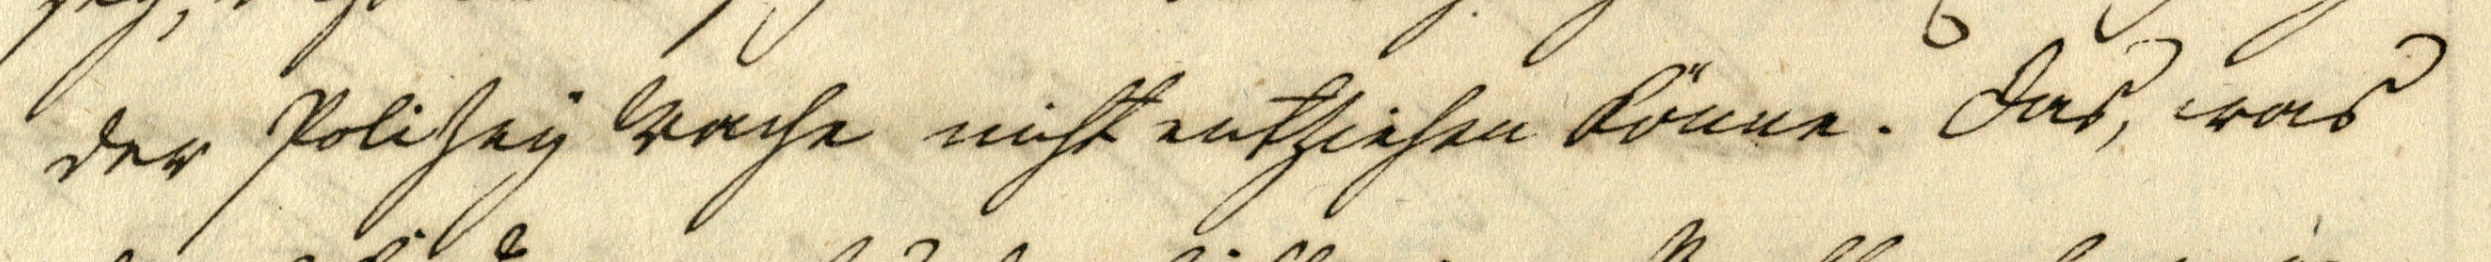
der Polizey Wache nciht entziehen könne. Das, was
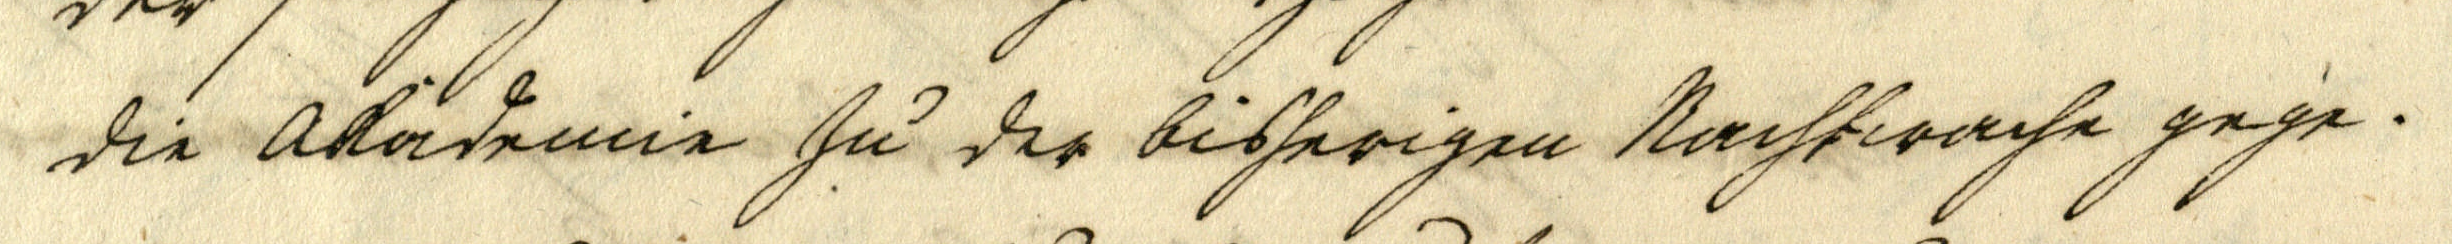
die Akademie zu der bisherigen Nachtwache gege-
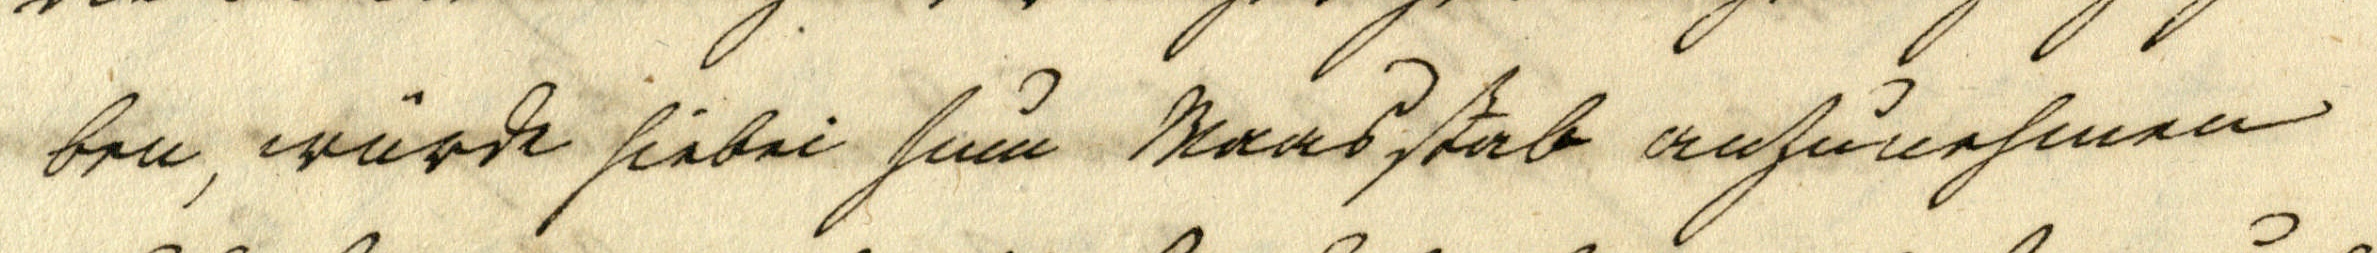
ben, würde hiebei zum Maasstab anzunehmen
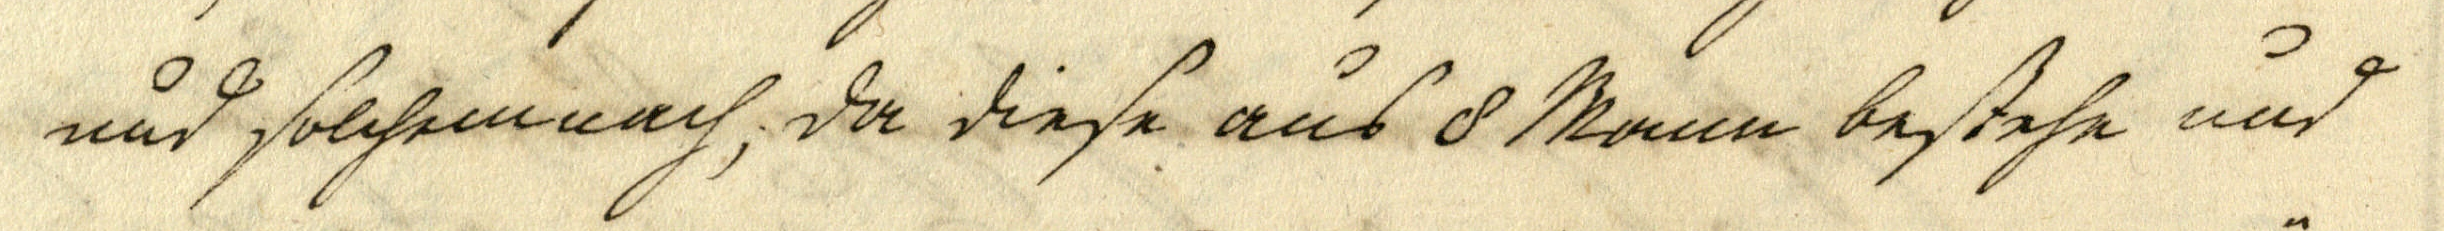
und solchemnach, da diese aus 8 Mann bestehe und
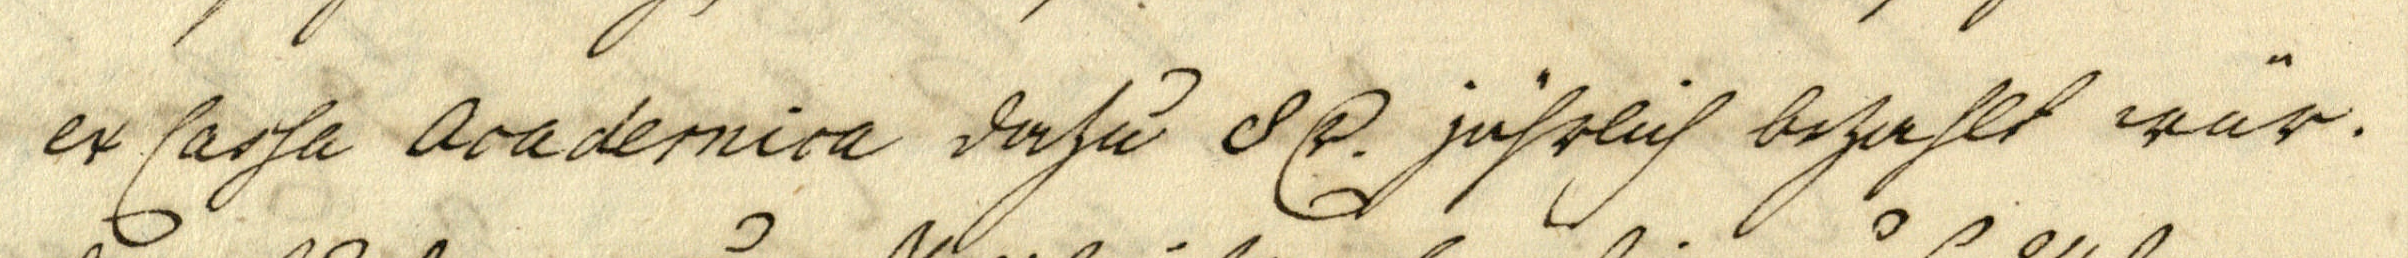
ex Cassa Academica dazu 8 rtl. jährlich bezahlt wür-
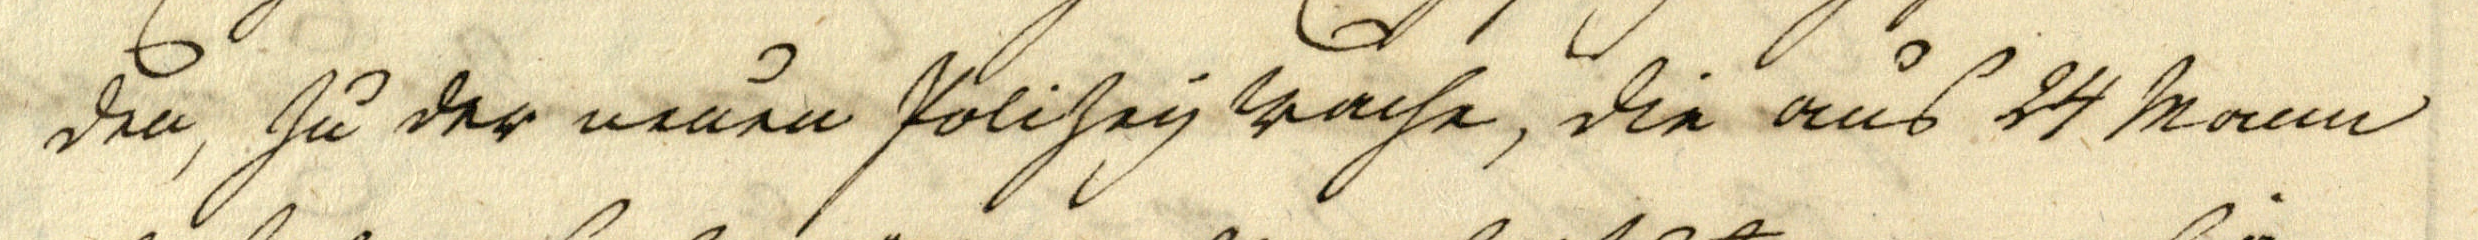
den, zu der neuen Polizey Wache, die aus 24 Mann
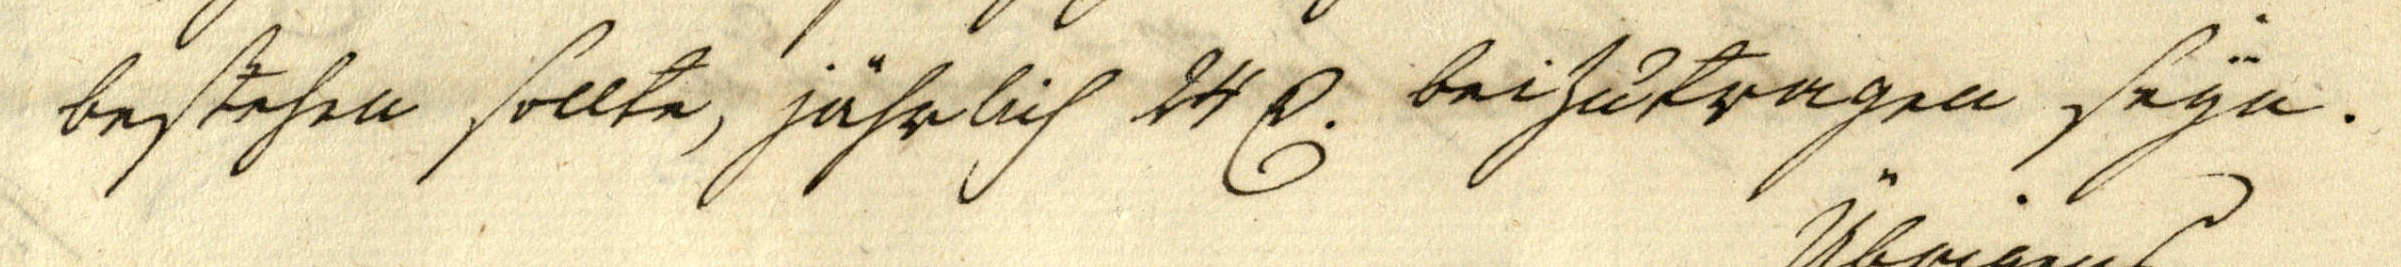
bestehen sollte, jährlich 24 rtl. beizutragen seyn.
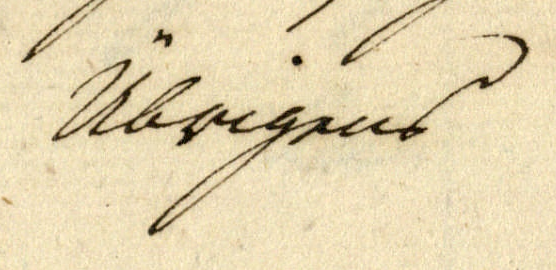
Übrigens
